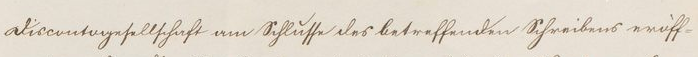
Discontogesellschaft am Schlusse des betreffenden Schreibens eröff-
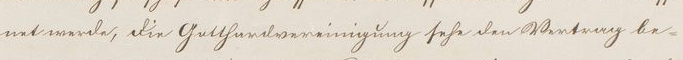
net werde, die Gotthardvereinigung sehe den Vertrag be-
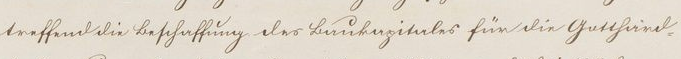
treffend die Beschaffung des Baukapitales für die Gotthard -
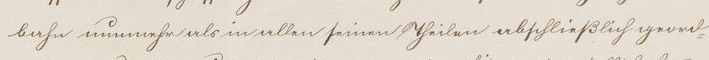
bahn nunmehr als in allen seinen Theilen abschließlich geord-
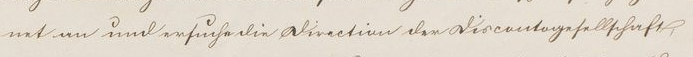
net an und ersuche die Direction der Discontogesellschaft,
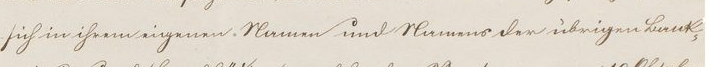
sich in ihrem eigenen Namen und Namens der übrigen Bank-
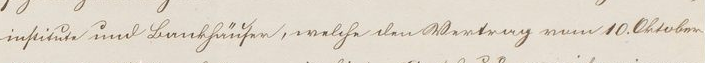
institute und Bankhäuser, welche den Vertrag vom 10. Oktober
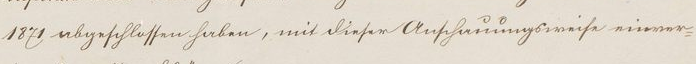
1871 abgeschlossen haben, mit dieser Anschauungsweise einver-
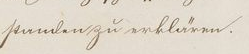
standen zu erklären.
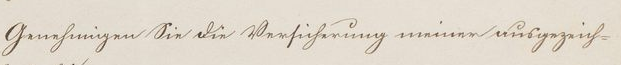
Genehmigen Sie die Versicherung meiner ausgezeich-
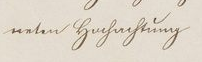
neten Hochachtung
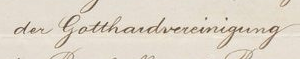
der Gotthardvereinigung
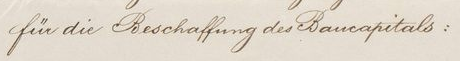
für die Beschaffung des Baucapitals:
